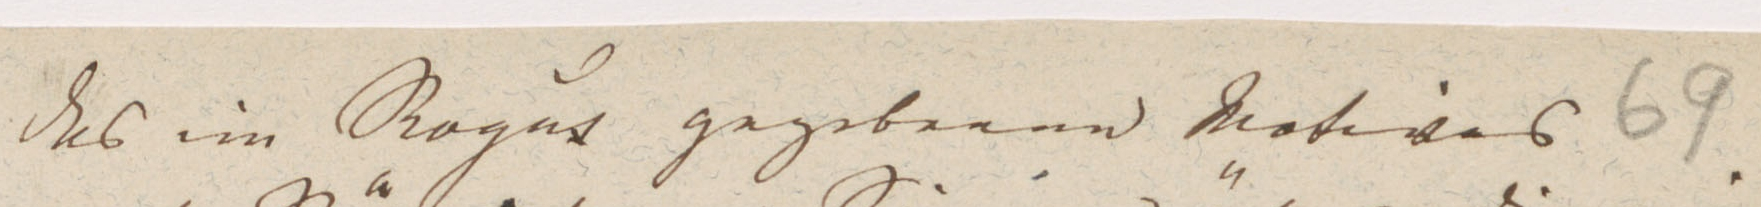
des im Rogus gegebenen Motives
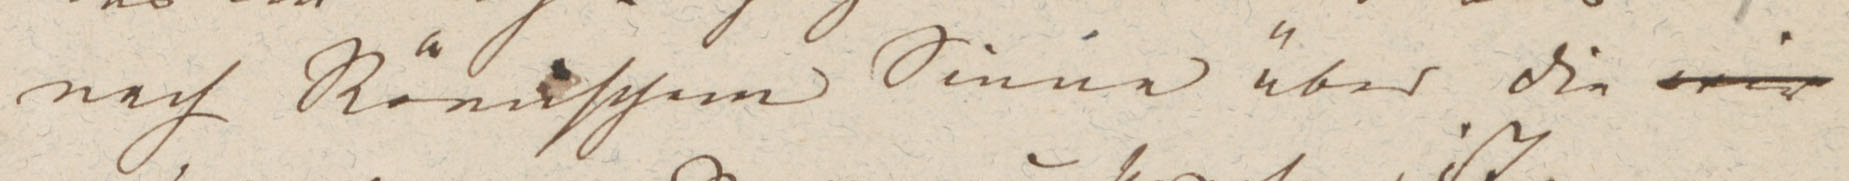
nach Römischem Sinne über die wir
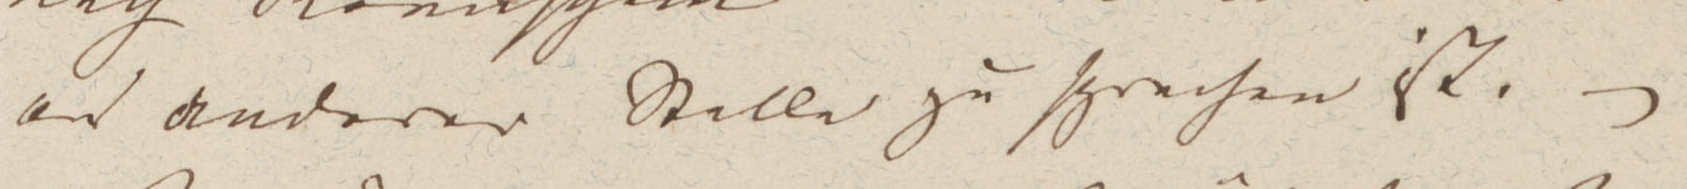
an anderer Stelle zu sprechen ist.
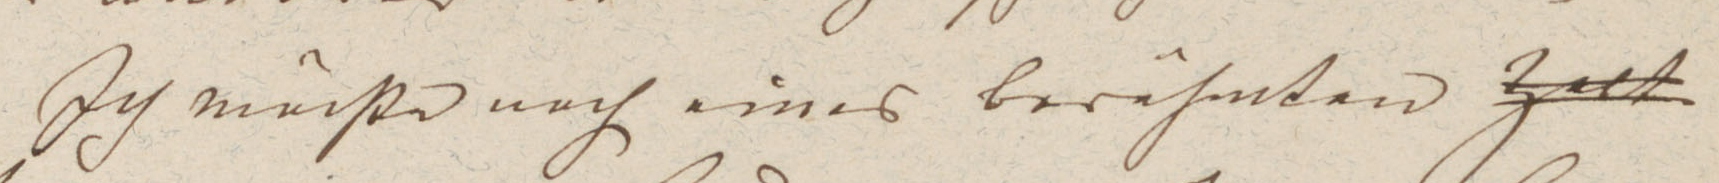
Ich möchte noch eines berühmten Zelt
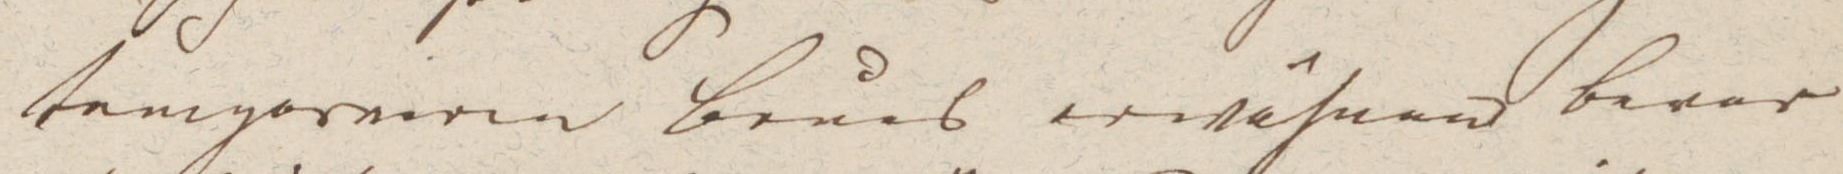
temporairen Baues erwähnen bevor
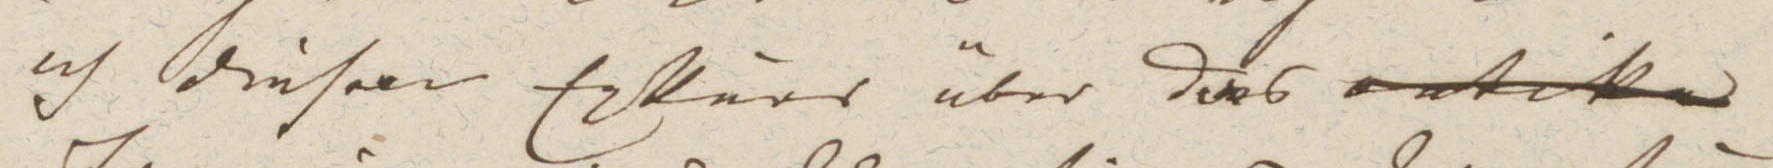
ich diesen Exkurs über ds antike
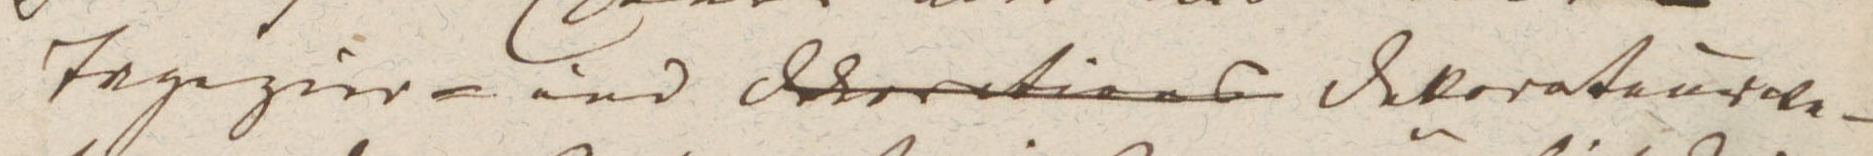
Tapezier- und Dekorations Dekorateurwe-
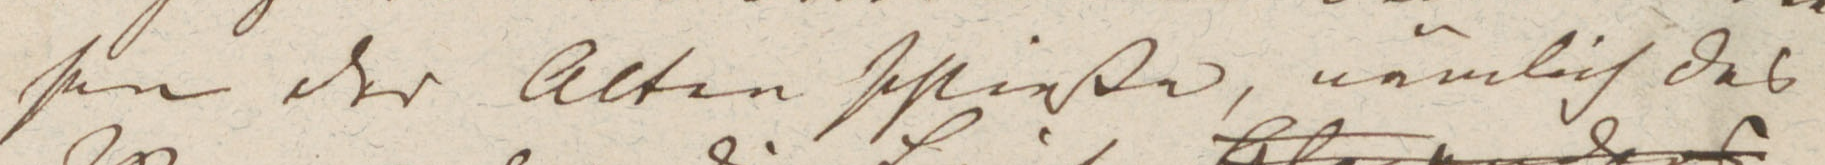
sen der ALten schliesse, nämlich des
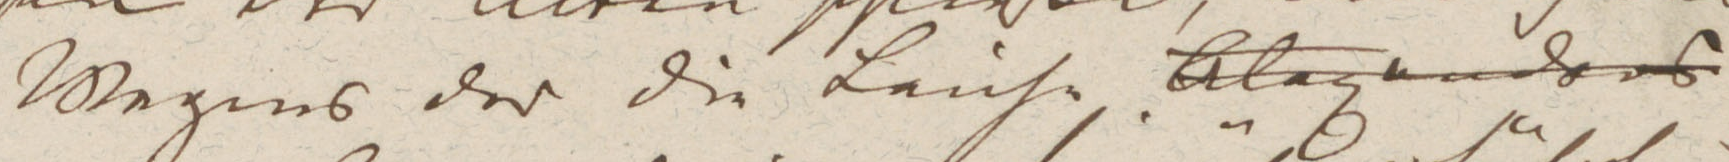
Wagens der die Leiche Alexanders
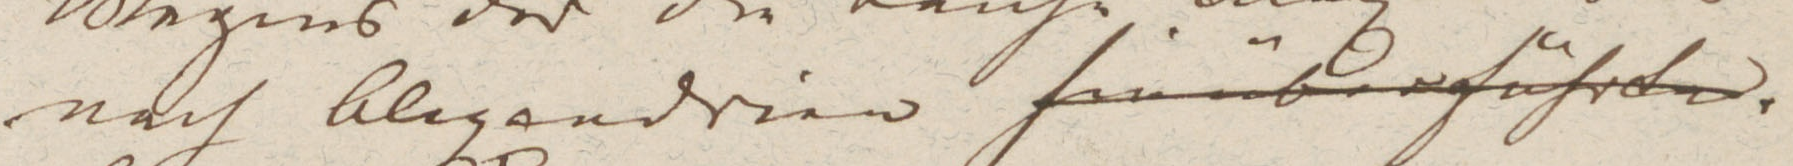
nach Alexandrien hinüberführte.
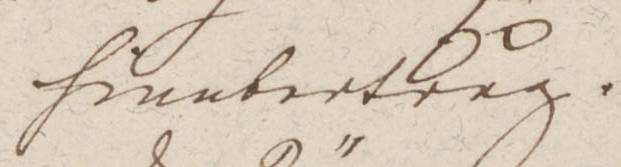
hinubertrug.
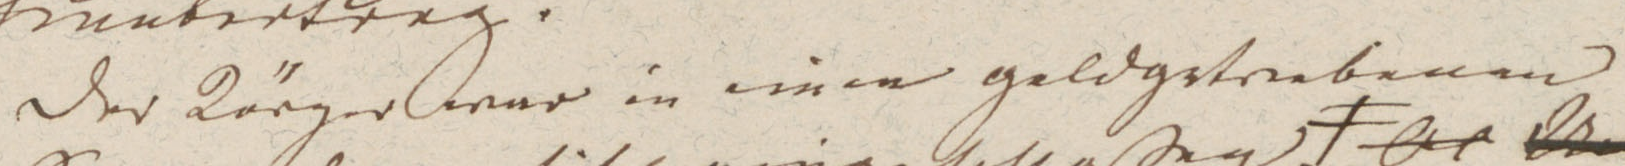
Der Körper war in einen goldgetriebenen
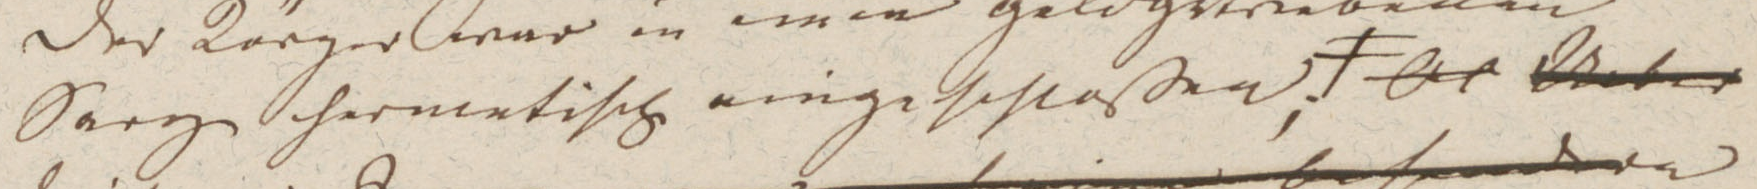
Sarg hermetisch eingeschlossen; % Ueber
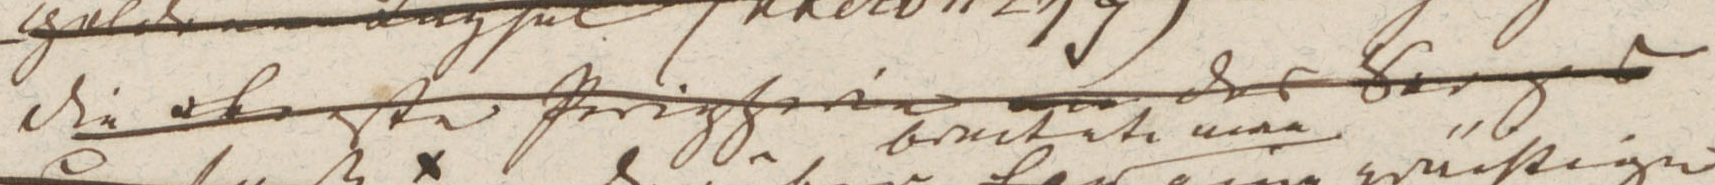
die oberste Peripherie des Sarges
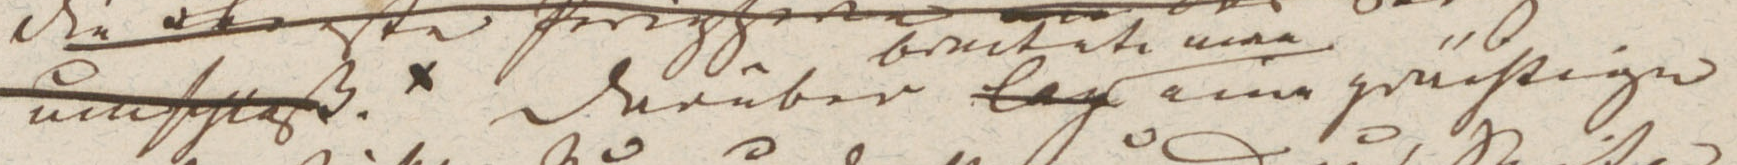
umschloss. % Darüber lag breitete man eine prächtige
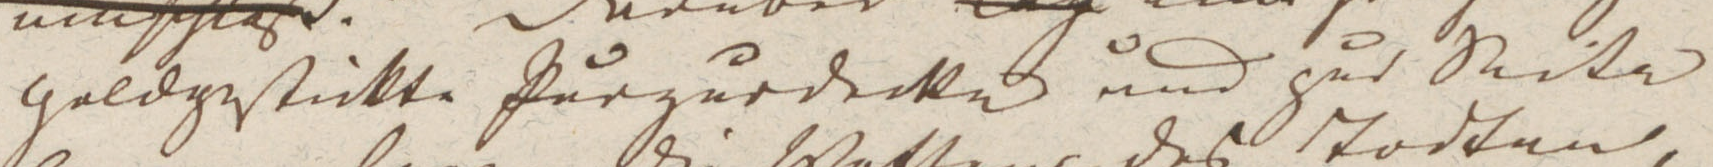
goldgestickte Purpurdecke und zur Seite
